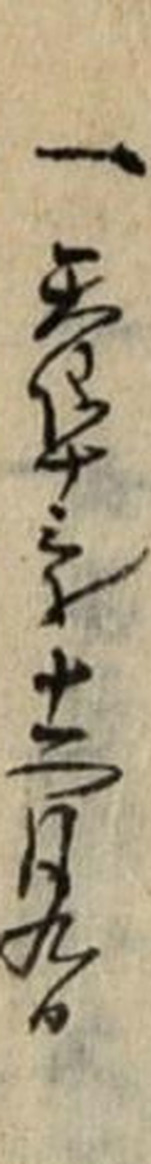一天保十三寅十二月九日
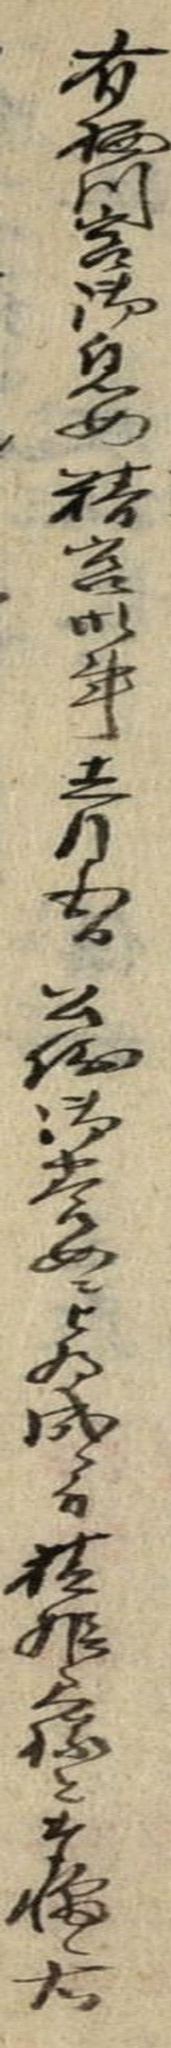有栖川宮御息女精宮御事去月五日公儀御養女に被為成候付精姫君様と奉称候右
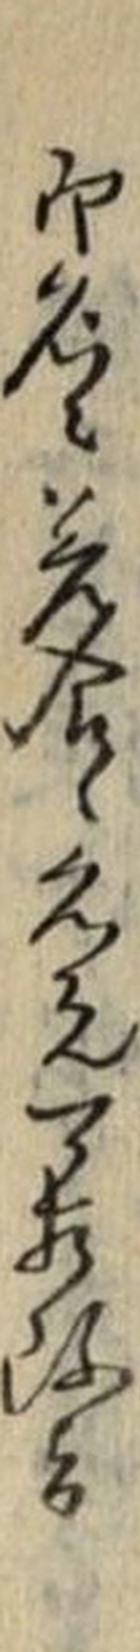御名に差合候名元可相改旨
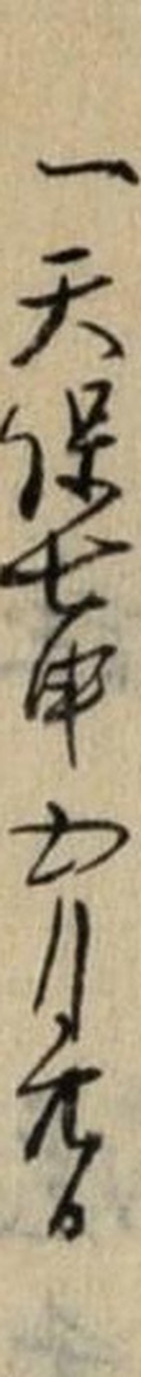一天保七申五月廿日
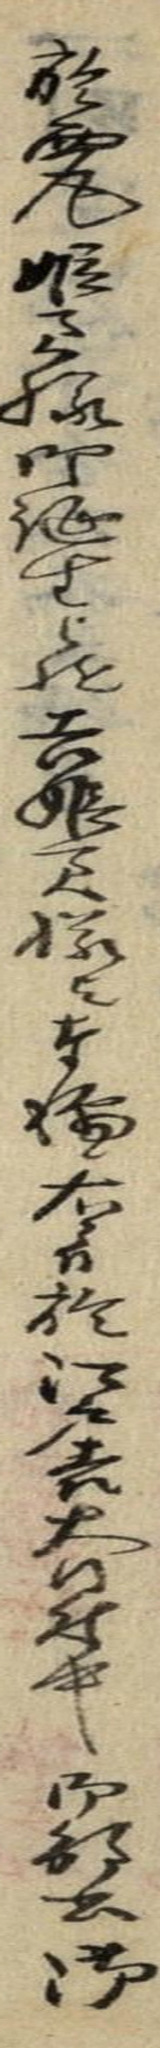於西丸姫君様御誕生被遊吉姫君様と奉称候右に付於江戸表大目付中御触書御
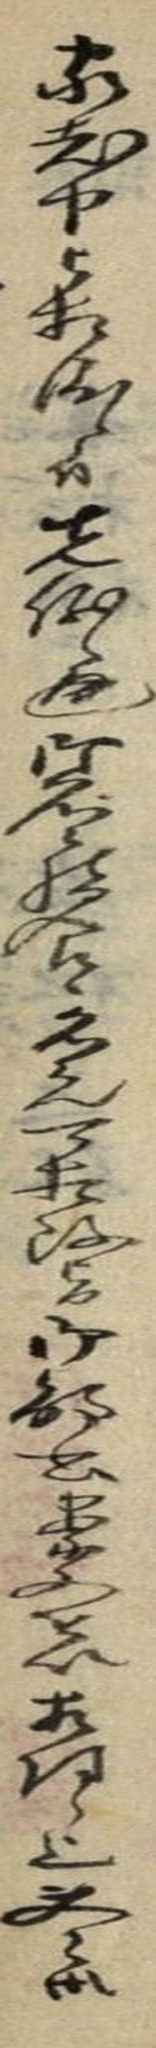家老中被相渡候付先例之通御名に指合候名元可相改旨御触書案文を以相伺候上夫々御
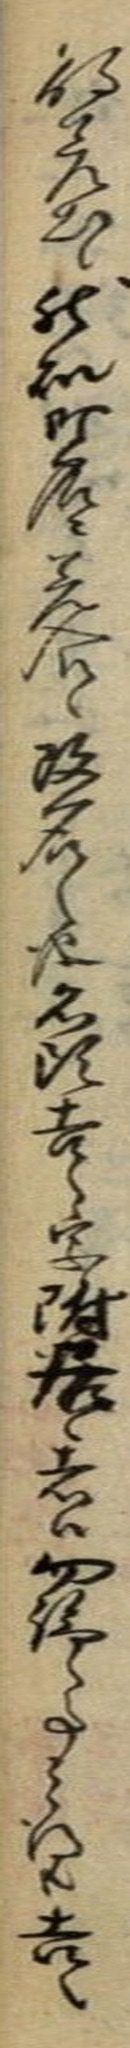触差出候然処御名に差合候改名之儀名頭吉之字附居候者は勿論之事に候得共吉之
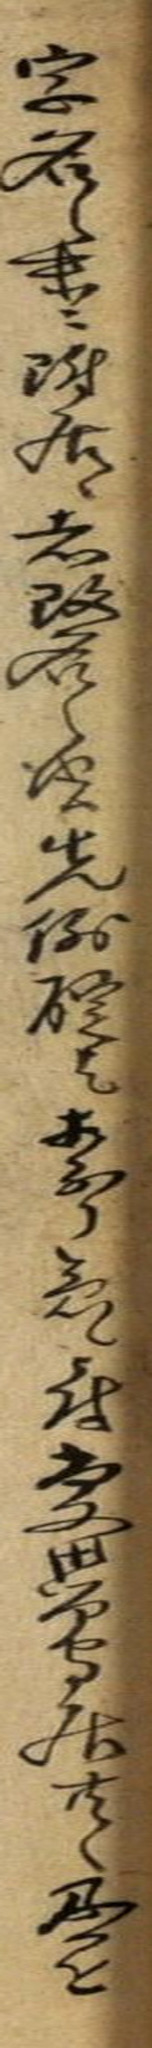名之末に附居候者改名之儀は先例聢と相分り兼候に付尚又御留守居共へ及懸
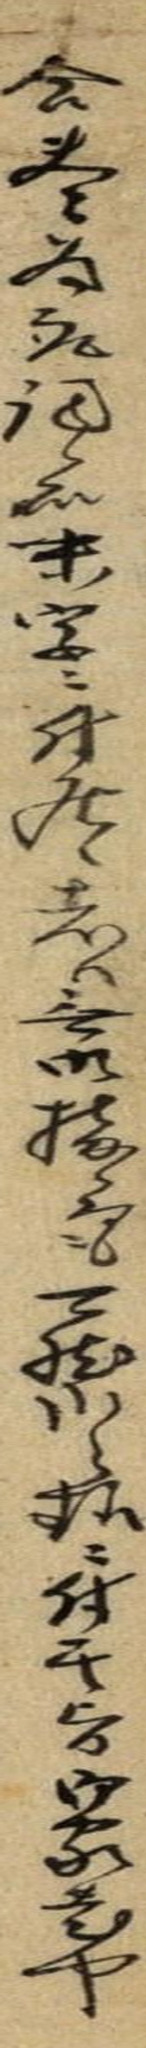合夫々為取調候処未字に付居候者は無御構候而も可然哉之趣に付其旨御家老中
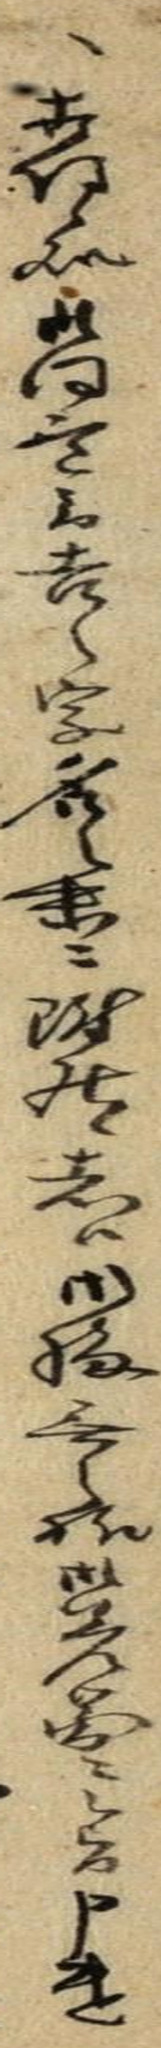へ相伺候処御同意に而吉之字名之未に附居候者は御構無之様御差図に候旨申遣
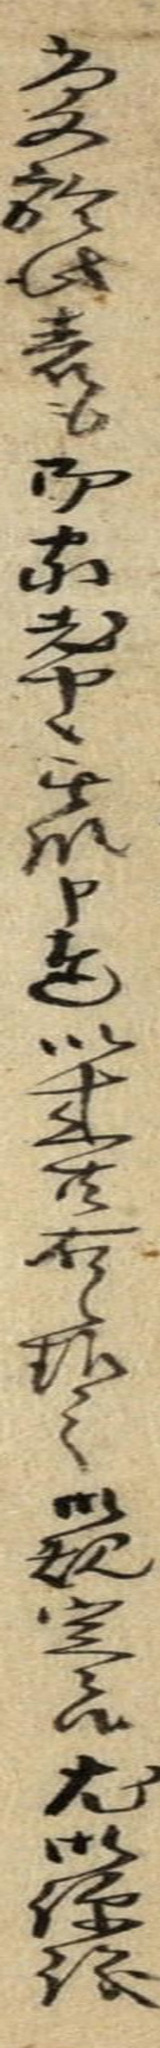尚又於此表も御家老中へ其段申達以来共右之趣之御規定に候尤御評議
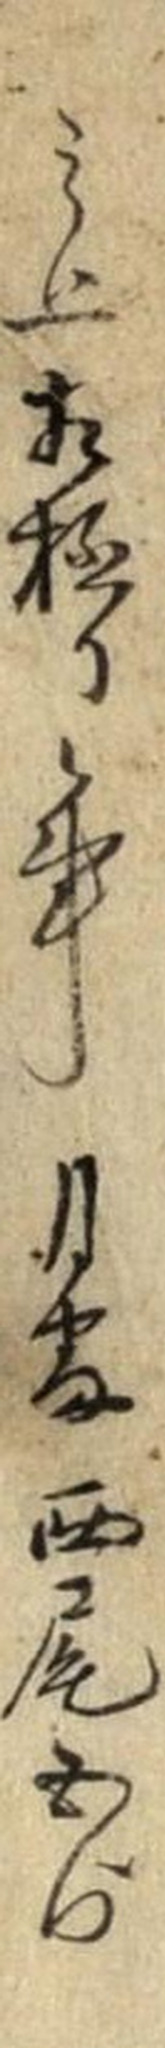之上相極り候事月番西尾五右衛門
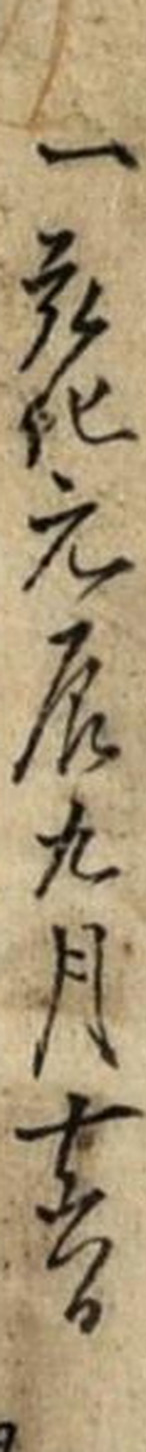一弘化元辰九月廿六日
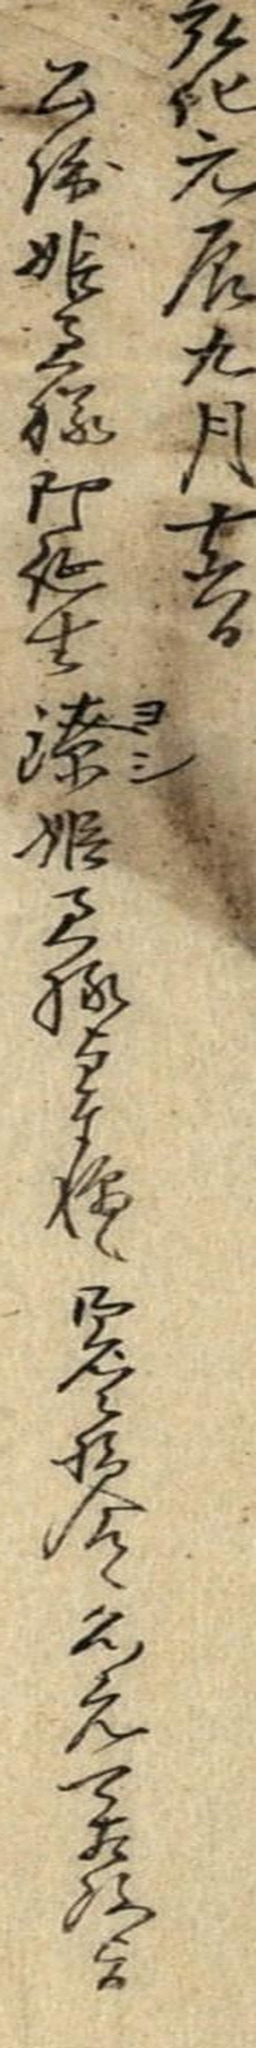公儀姫君様御誕生潦姫君様と奉称候御名に指合候名元可相改旨
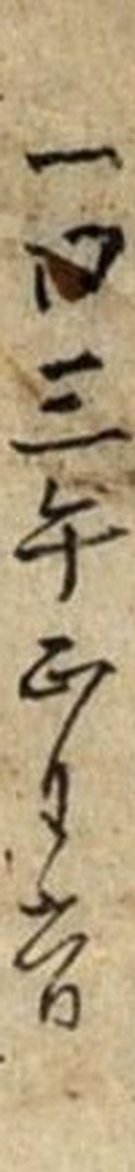一同三午正月六日
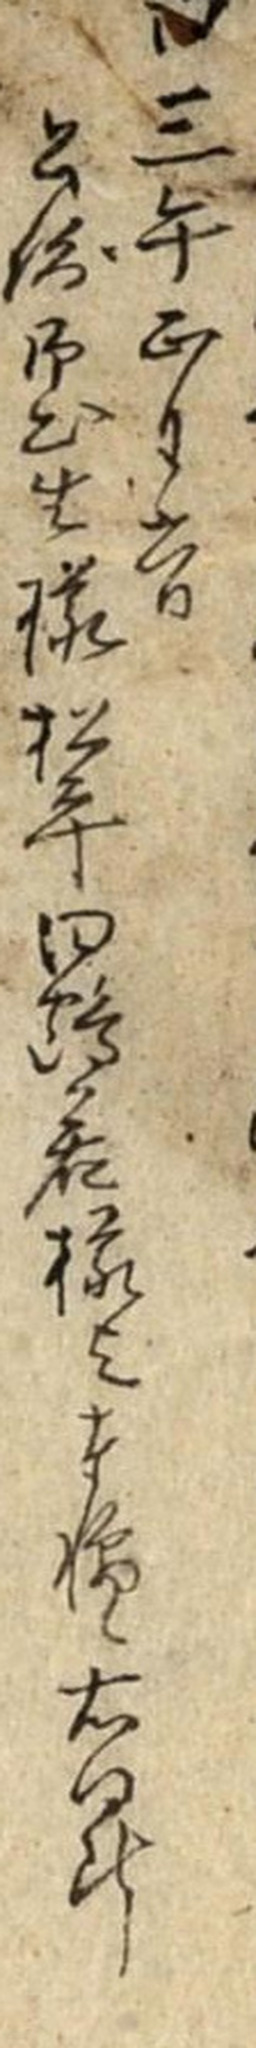公儀御出生様松平田鶴若様と奉称候右同断
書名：蒐輯之部
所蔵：福井県文書館 Fukui Prefectural Archives
